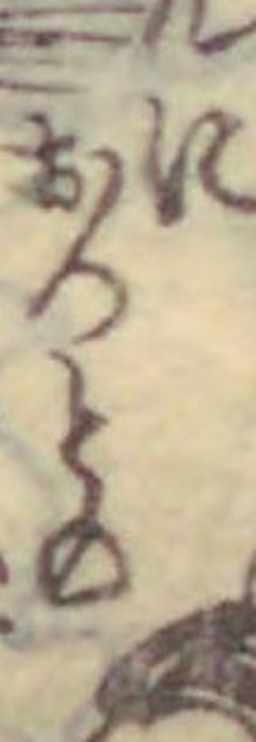おつとの
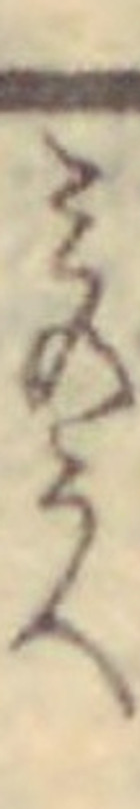みのうへ
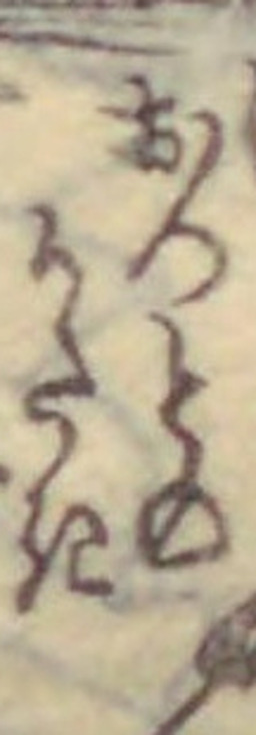かたき
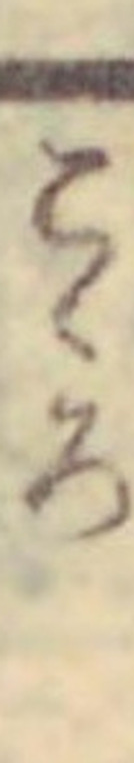こゝろ
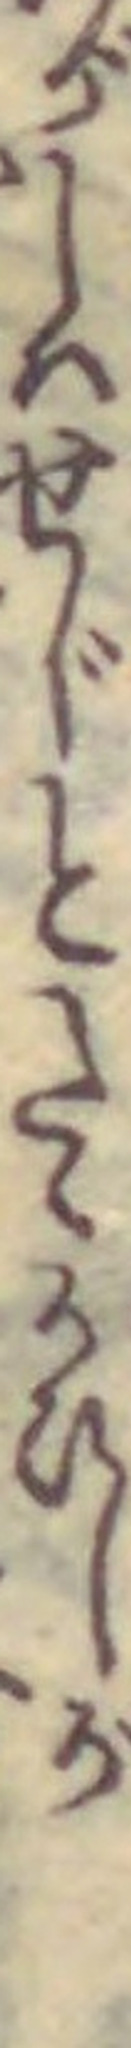のがしはせじとたゝかひしが
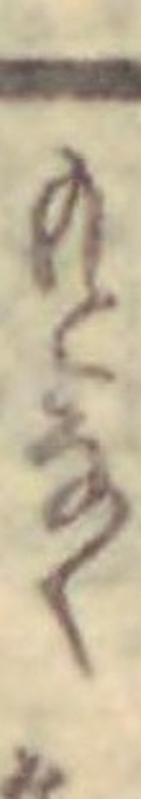もとなく
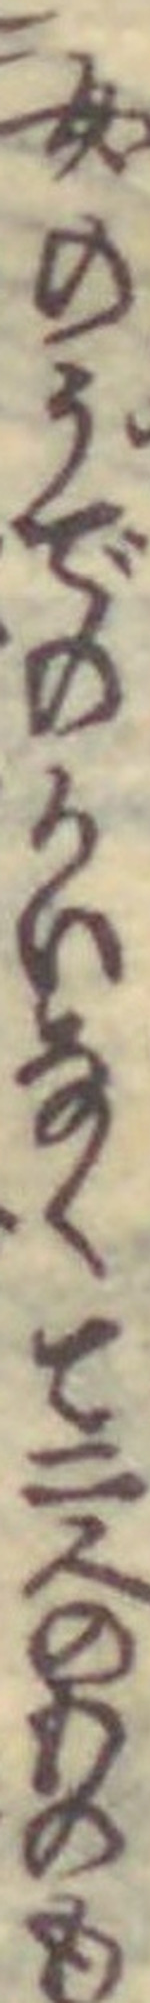女のうでのかいなくて二人のものも
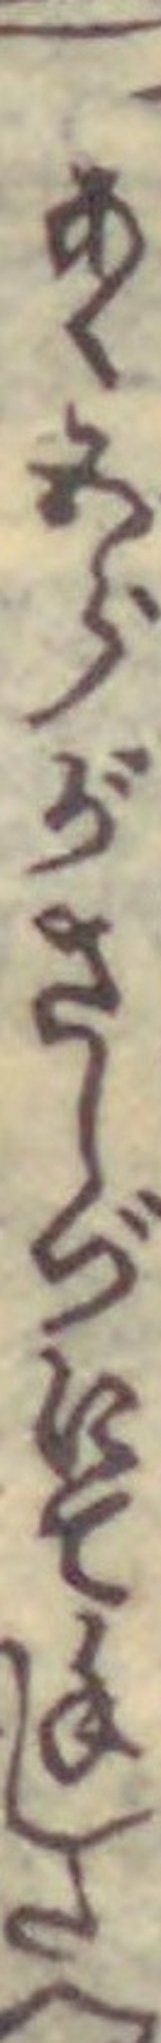あく五郎がさしづにて手した
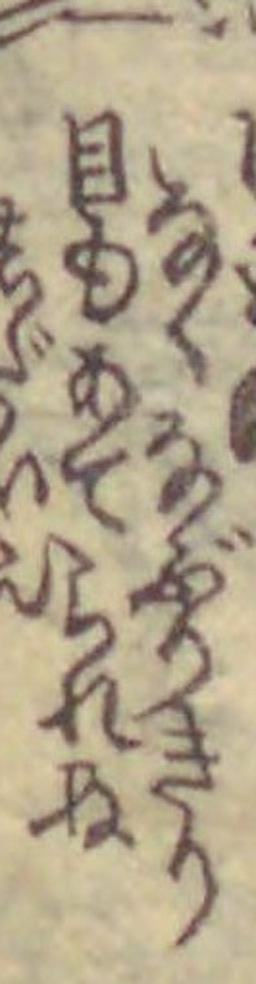目もあてられぬ
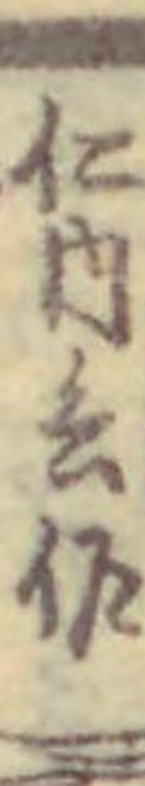仁内兵作
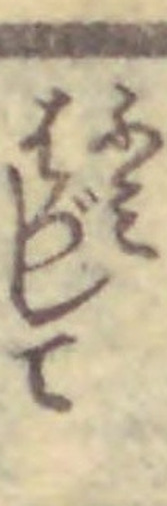はづして

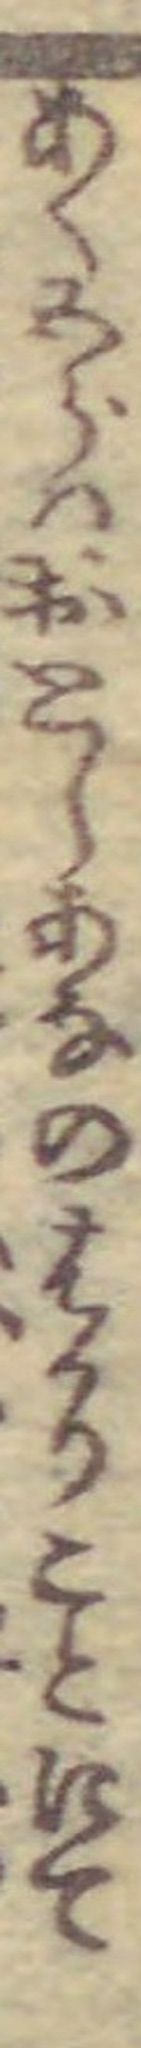あく五郎はおとしあなのはかりことにて
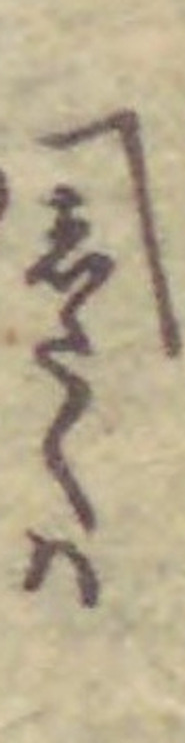〽したくは
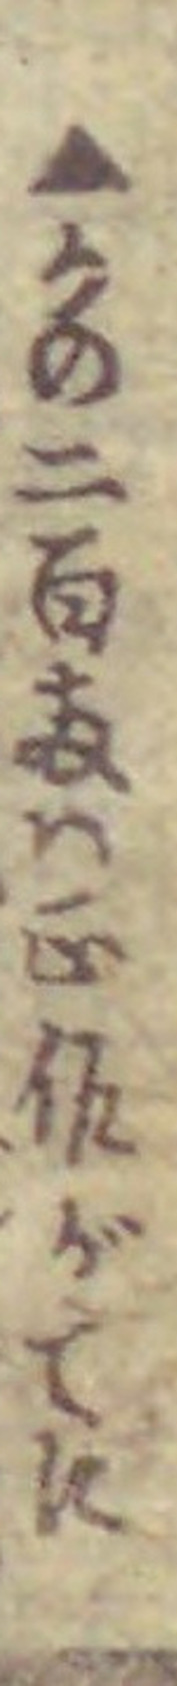▲かの二百両は正作がてに
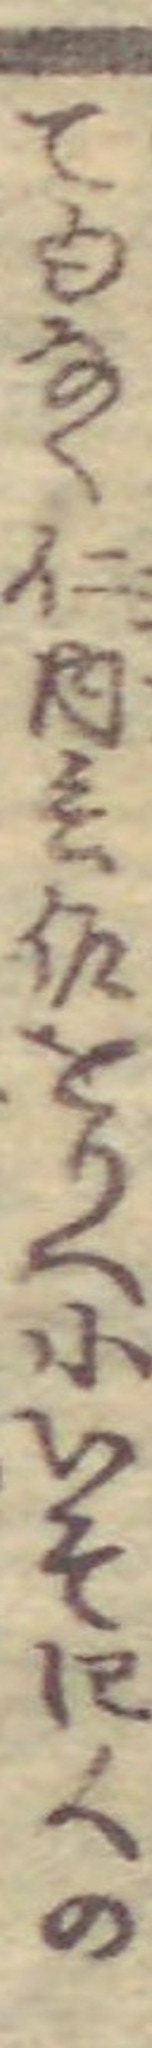てもなく仁内兵作をりへ小いそ四人の
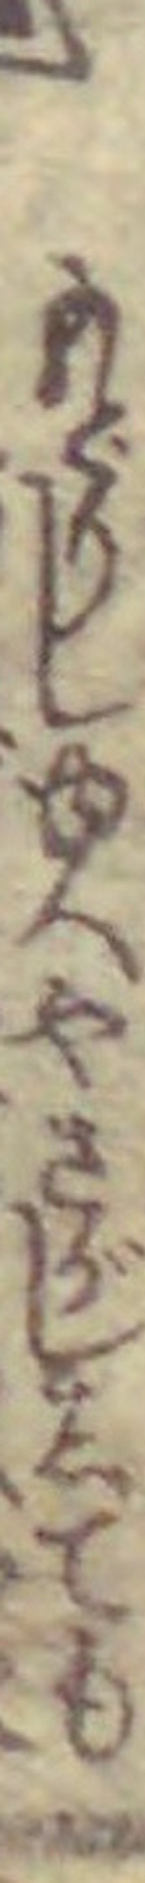もどりしゆへやさがししても
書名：八ツ目鱣因縁物語 3巻
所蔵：国立国会図書館 National Diet Library, JAPAN
